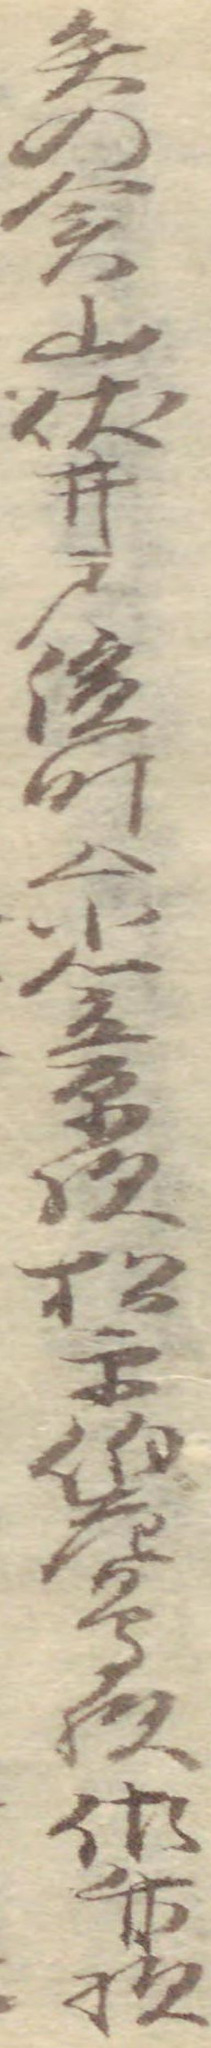矢の倉山伏井戸濱町△小笠原様松平伯耆守様佐竹様
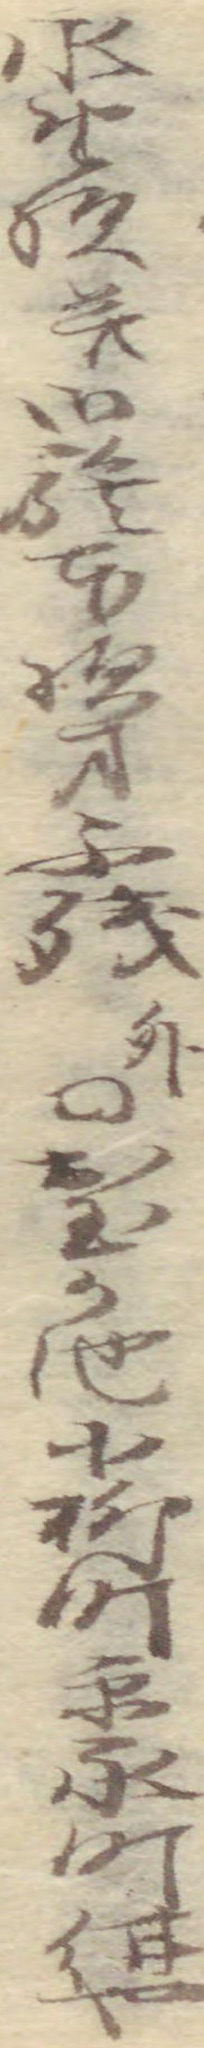水野様幷御旗本様方不残外〇お玉か池小柳町平永町紺や
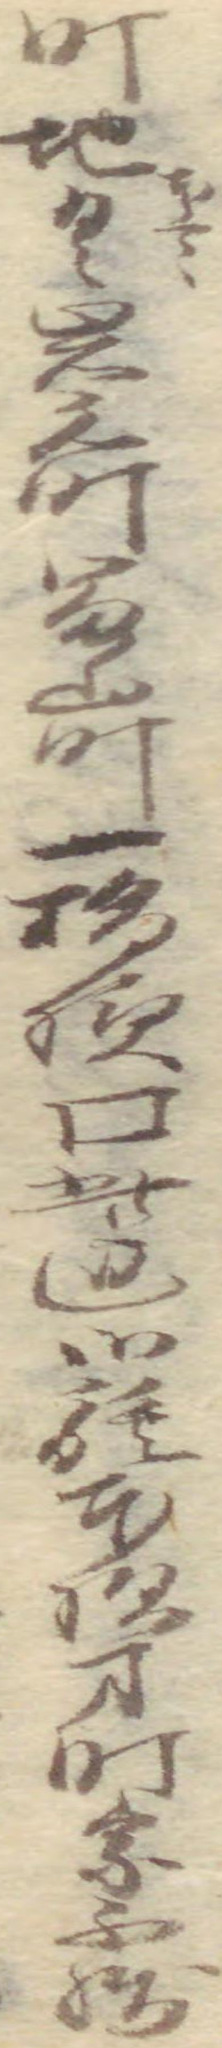町地く本之マヽ岩元町冨山町一橋様此通御旗本様方町家不残
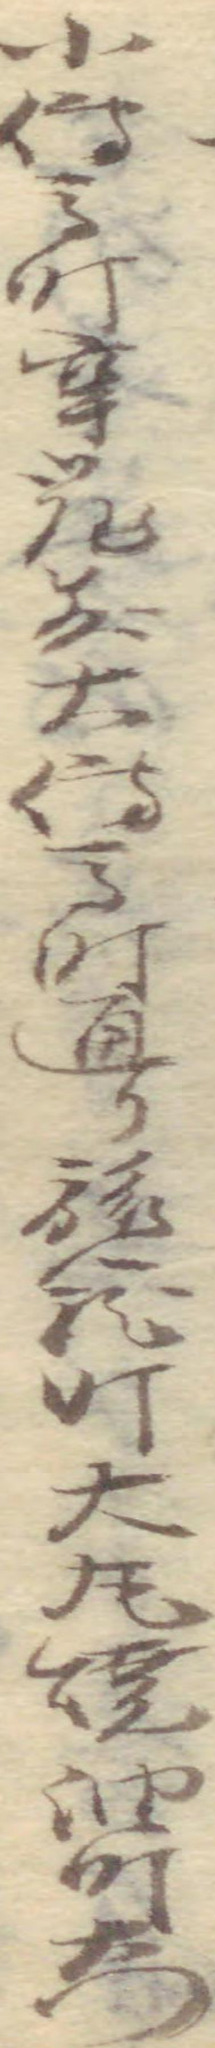小伝馬町牢御屋敷大伝馬町通り旅籠町大丸焼油町大門
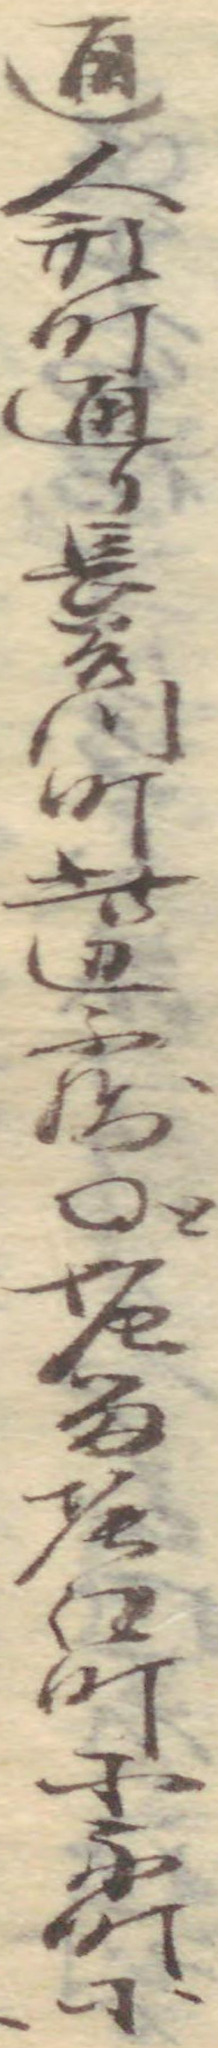通人形町通り長谷川町此辺不残〇と堀留堀江町小舟町小
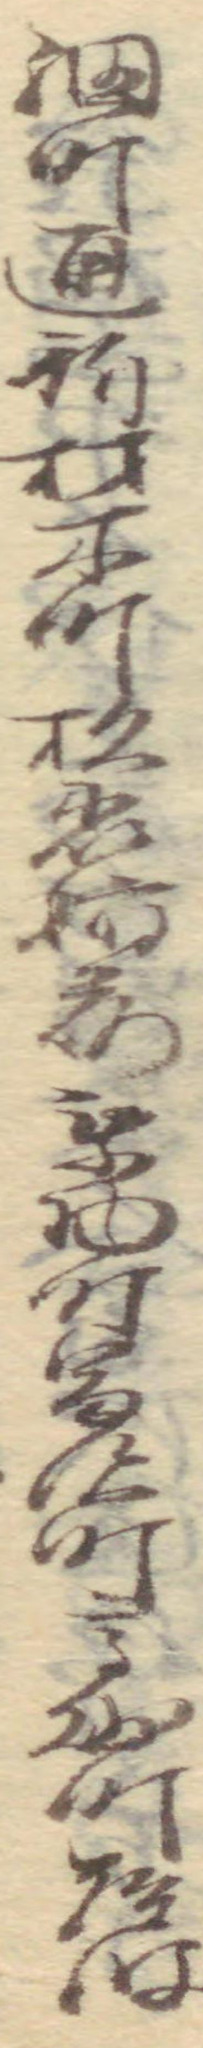網町通新材木町杦森稲荷乗物町冨沢町高砂町難波
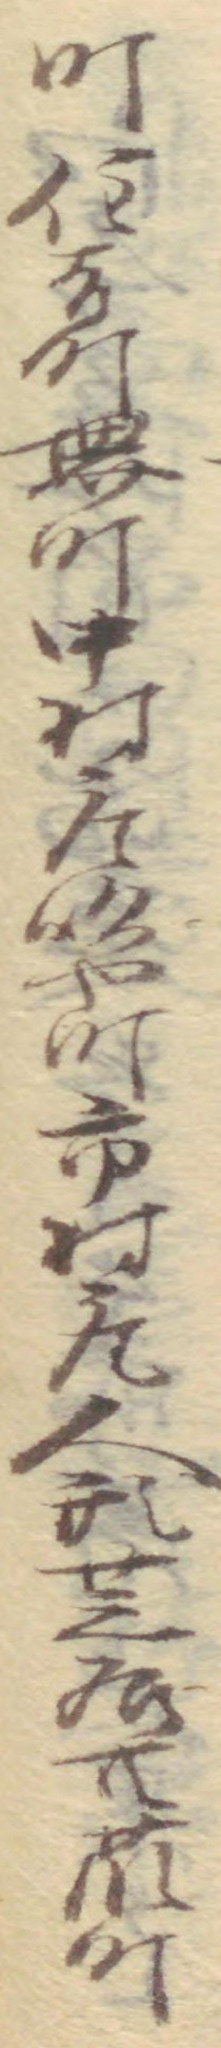町住吉町堺町中村座吹や町市村座人形芝居共葭町
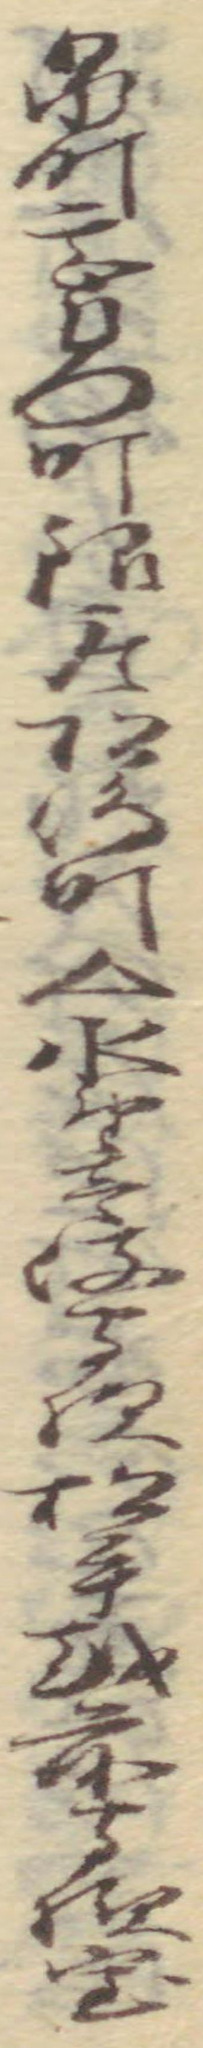泉町甚左衛門町銀座松嶋町△水野壱岐守様松平越前守様室
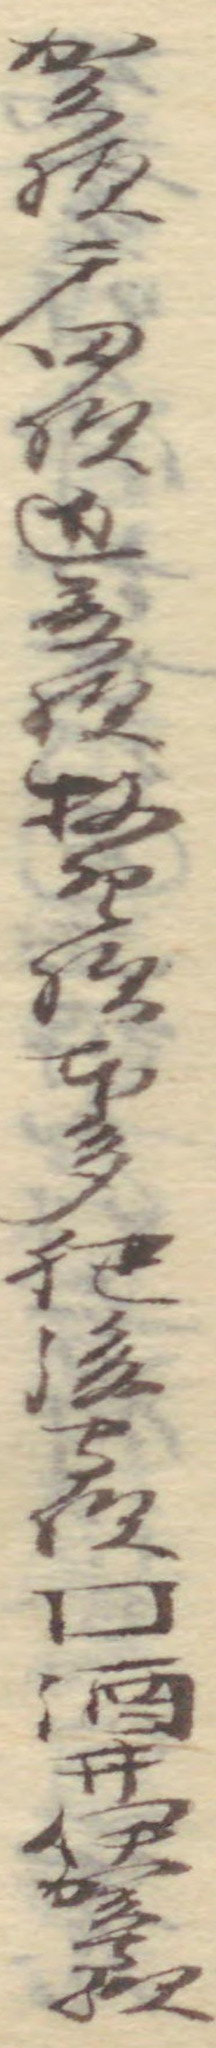賀様戸田様近藤様牧野様本多肥後守様酒井伊賀守様
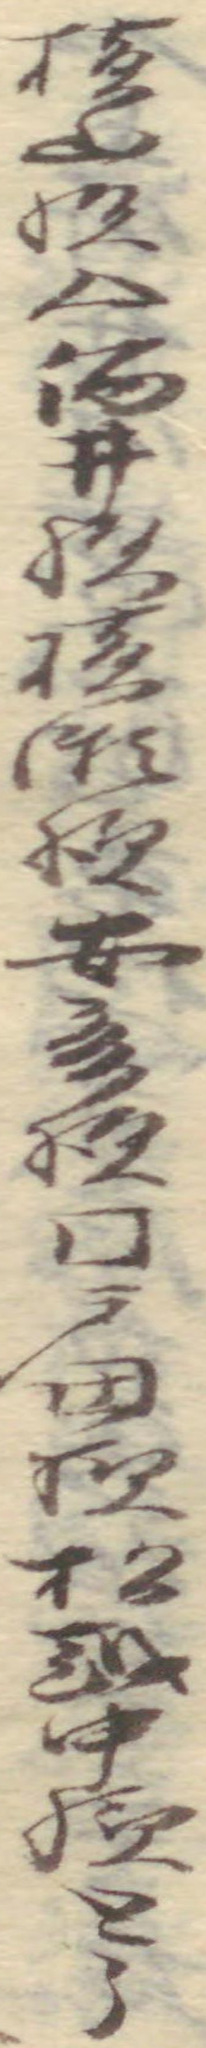横山様△酒井様横瀬様安藤様戸田様松越中様とう
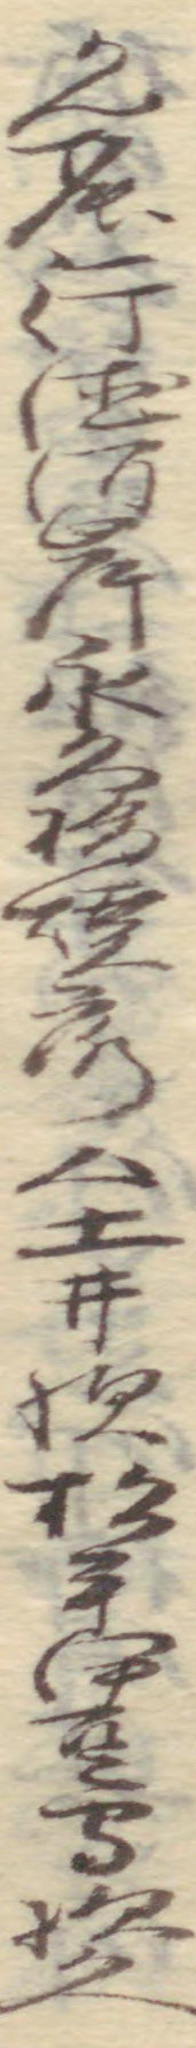かん堀行徳河岸永久橋焼落△土井様松平伊豆守様久
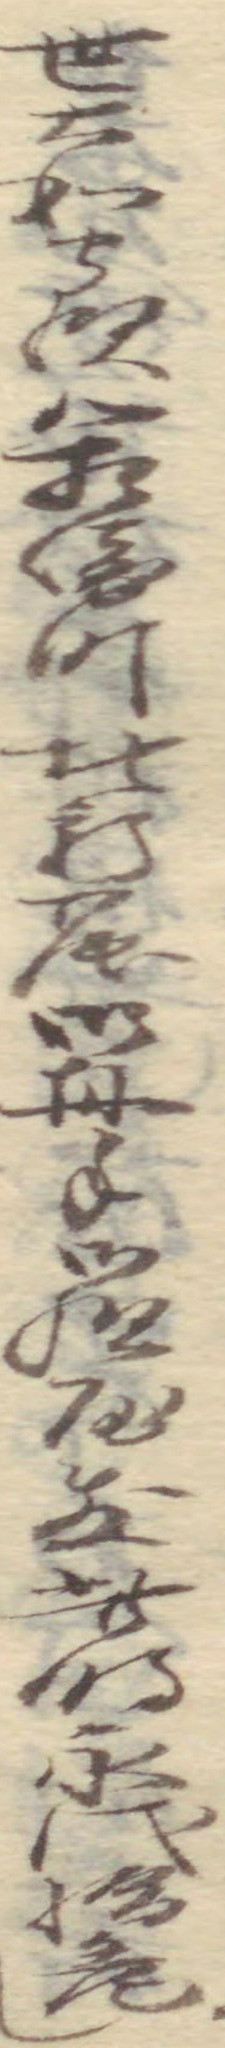世大和守様箱崎町北新堀御舟手御組屋敷此時永代橋危し
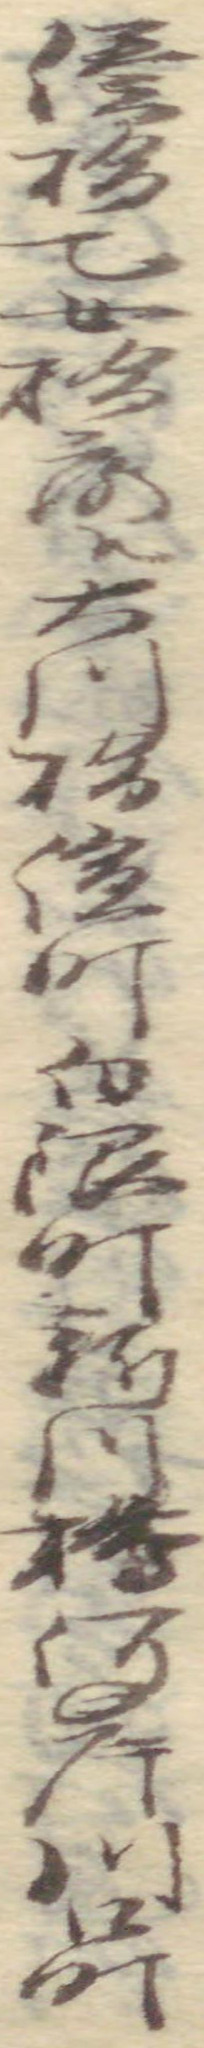湊橋乙女橋落る大川橋濱町白銀町新川橋河岸川口町
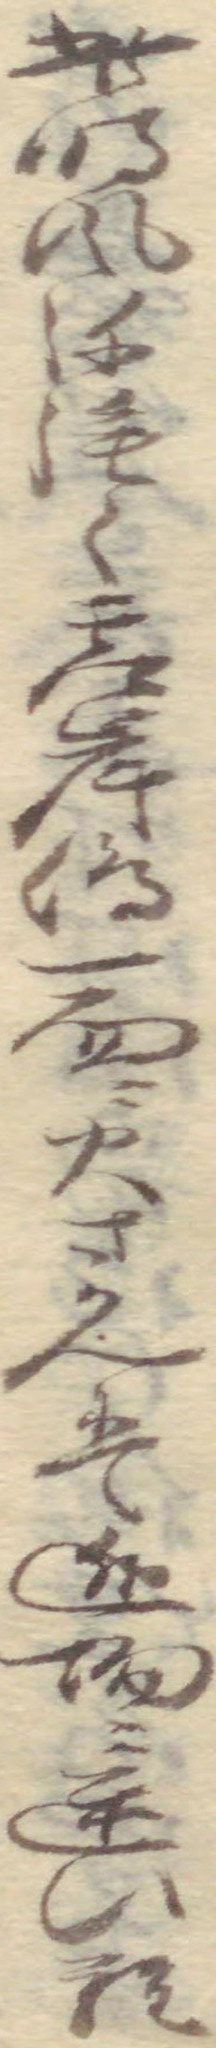此時風弥強く霊岸嶋一面ニ火さかんにて逃場ニ迷ひ難
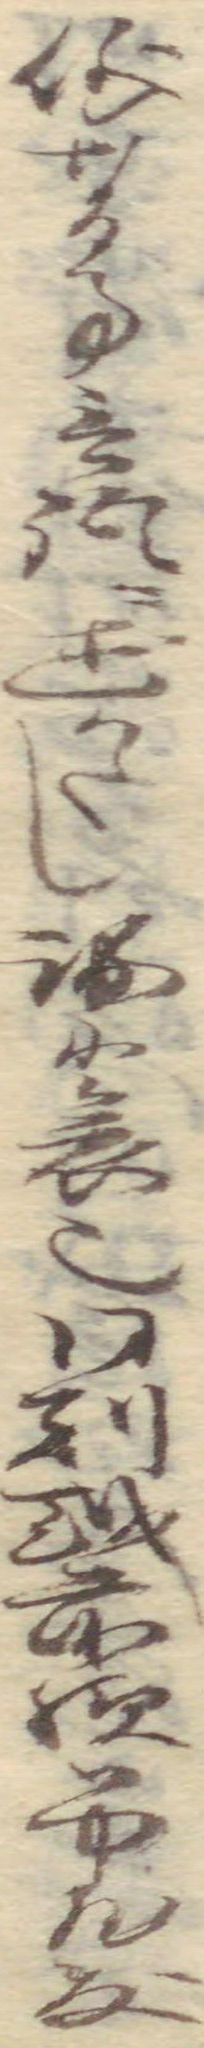儀なる事言語ニ述かたし誠ニ哀也同刻越前様御中屋敷
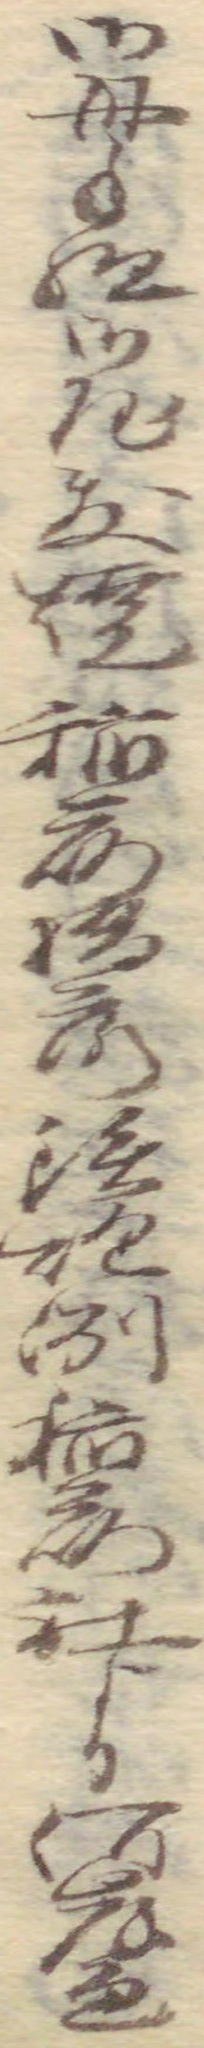御舟手組御屋敷焼稲荷橋落鉄砲洲稲荷社より河岸通
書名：鶯宿雑記. 巻199-200
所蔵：国立国会図書館 National Diet Library, JAPAN
